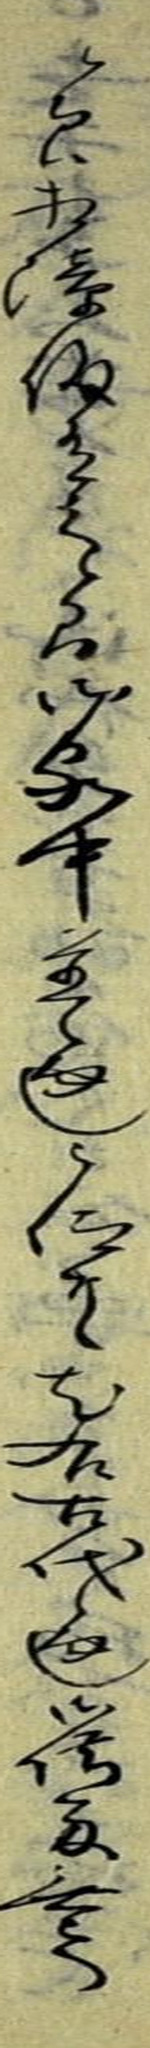候而ハ相障儀有之候間御家中並之通被仰付候尤右古代之通御借米無之
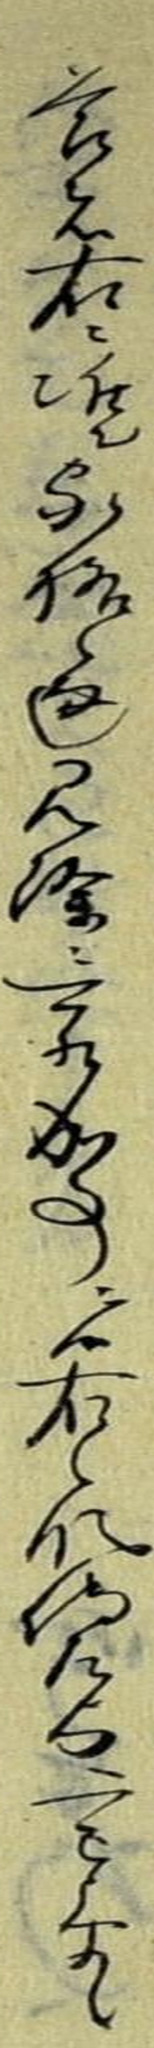節者右ニ准シ家格之通見除ニ可相成事ニ候右之段伝左衛門へ可被申聞候
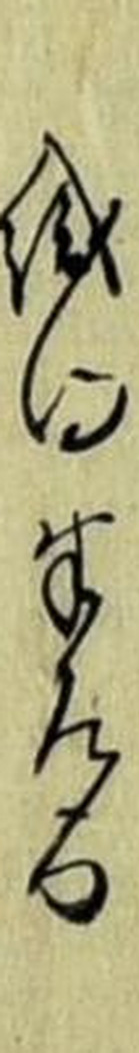織田半左衛門
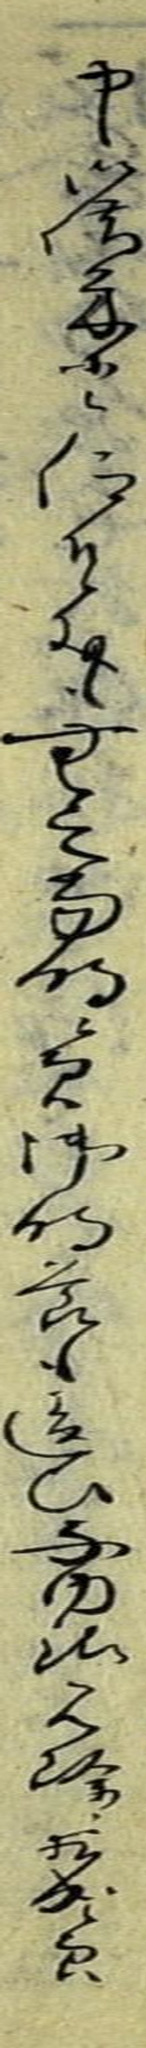中御借米等被仰付候義も無之当時ニ而ハ御時節も違ひ与内銀見除ニ相成
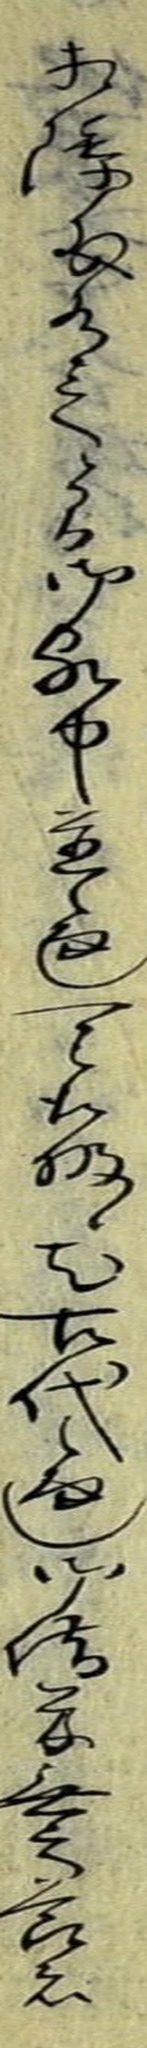相障義有之候間御家中並之通可被取扱候尤右古代之通御借米無之節者
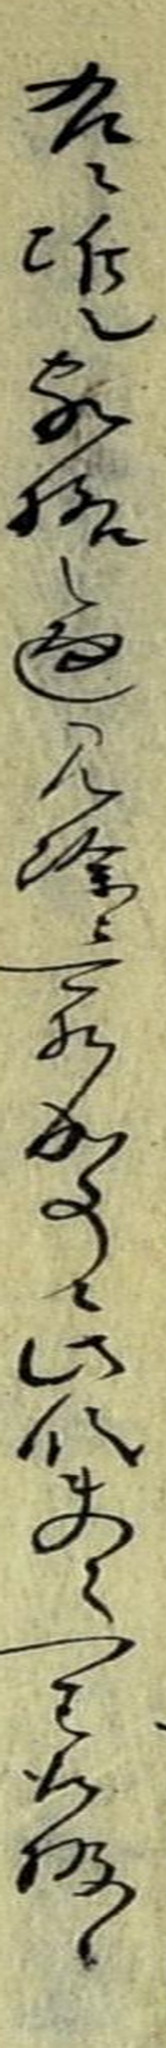右ニ准シ家格之通見除ニ可相成事候此段夫々可被取扱候
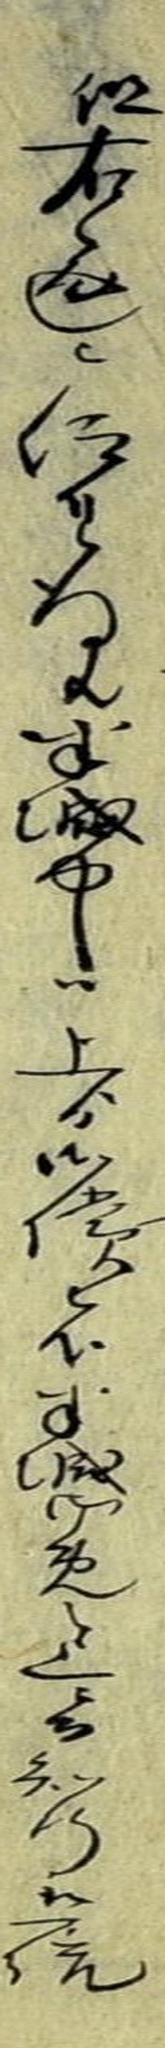但右之通被仰付候得共半減中ハ上ゟ御償被下半減御免之上ニ而知行取一統
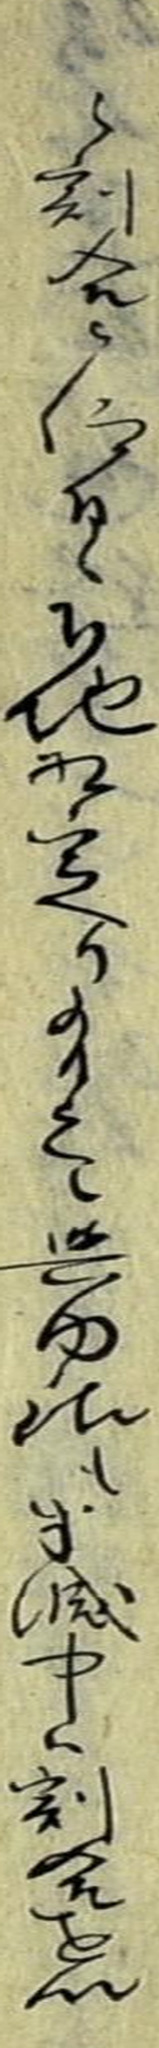之割合被仰付候下地相定り有之候与内銀も半減中ハ割合を以
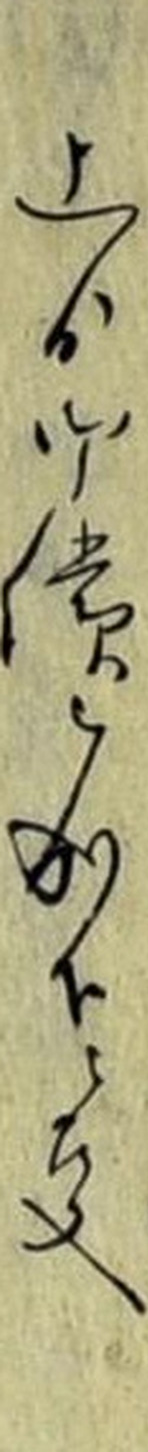上ゟ御償被成下候事
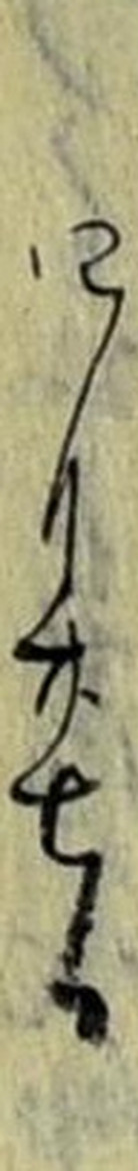四月廿七日
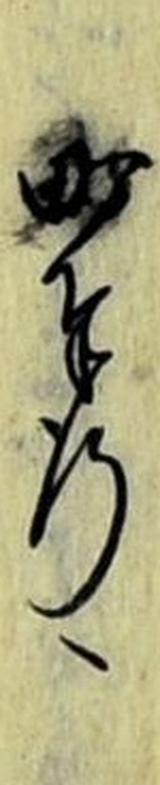町奉行へ

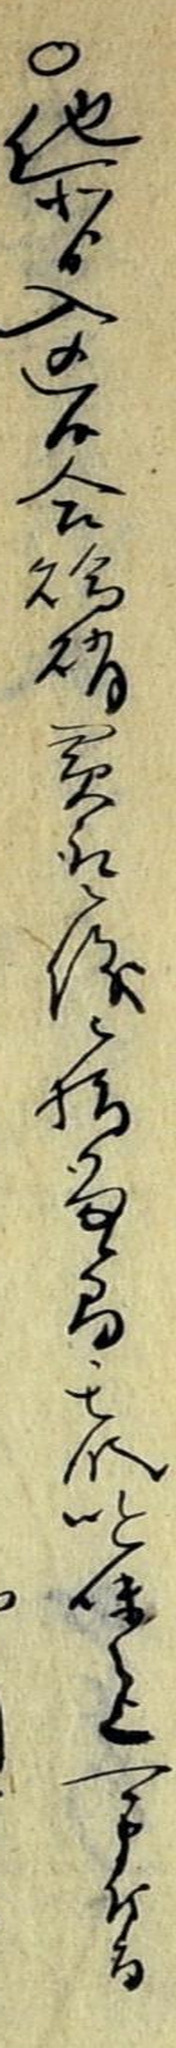〇他所ゟ入込候合焔硝買取候儀被指留候間其段吟味之上可申付旨
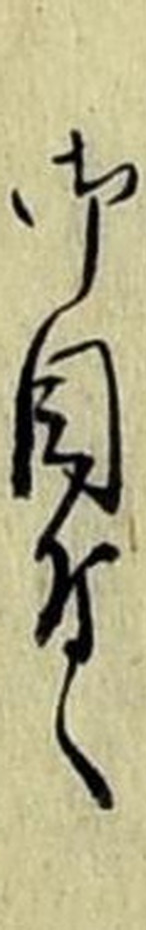御目付へ
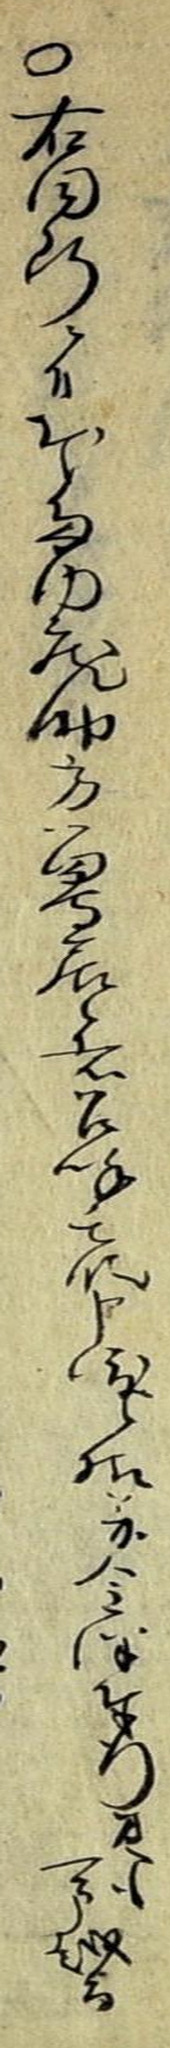〇右同断ニ付本多内蔵助方留守居之者召呼其段申渡候様并金津奉行方へも可申越旨
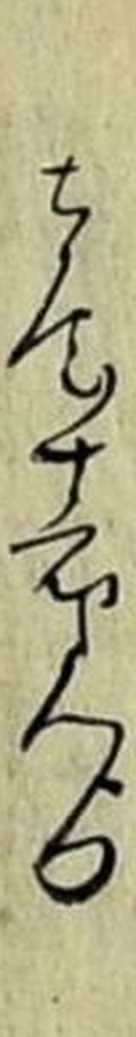土屋十郎右衛門
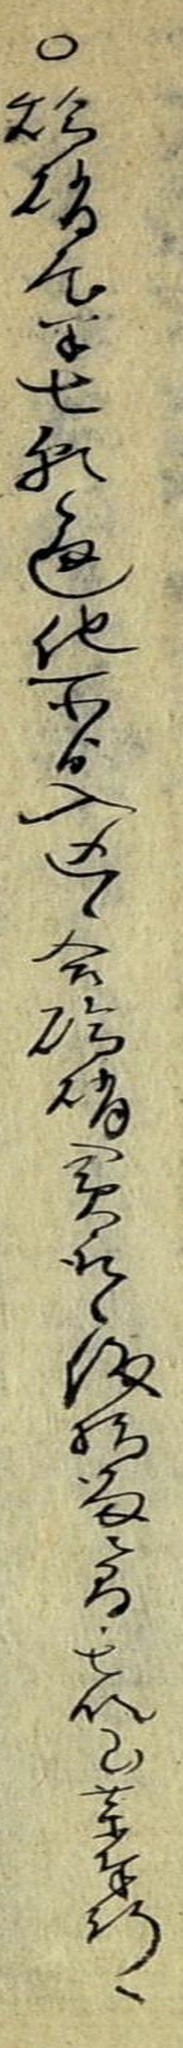〇焔硝屋半七願之通他所ゟ入込候合焔硝買取之儀指留候間其段玉薬奉行へ
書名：命令之部 三
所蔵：福井県文書館 Fukui Prefectural Archives
